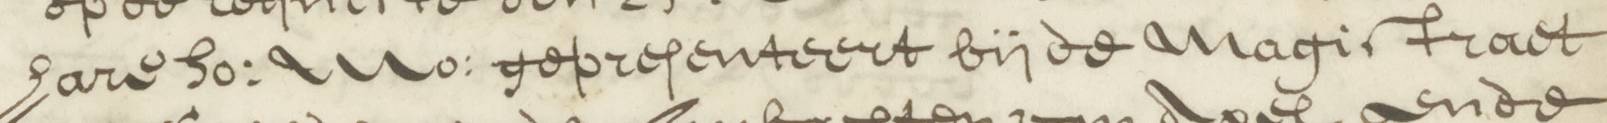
hare ho:Mo: gepresenteert bij de Magistraet
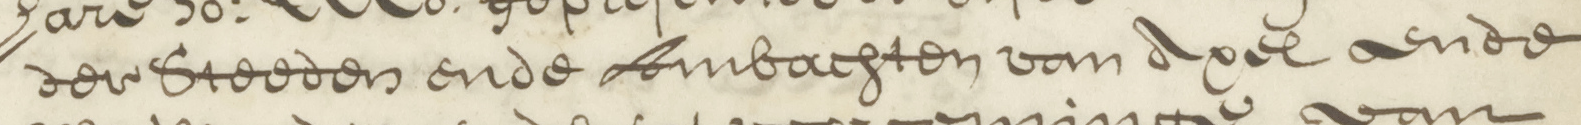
der Steeden ende Ambachten van Axel ende
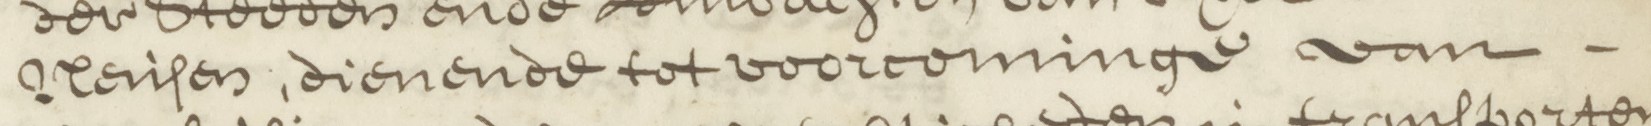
Neusen, dienende tot voorcominge van -
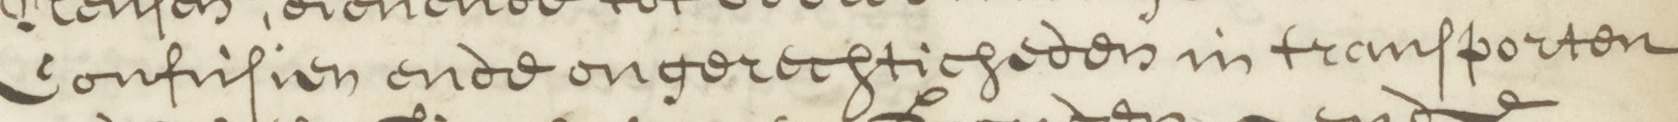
Confusien ende ongerechticheden in transporten
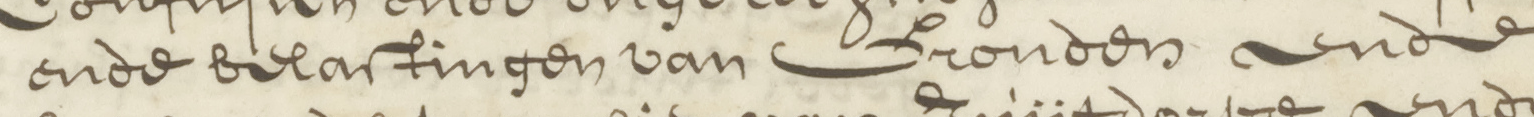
ende belastingen van Gronden ende
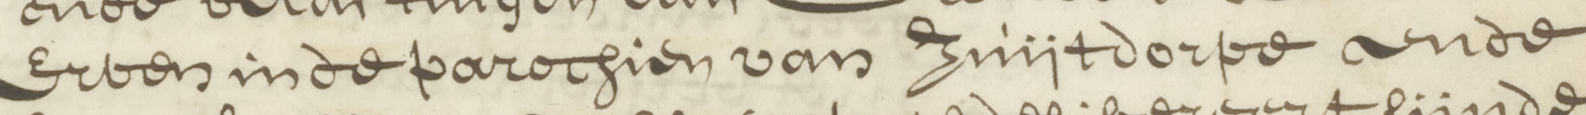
Erven in de parochien van Zuijtdorpe ende
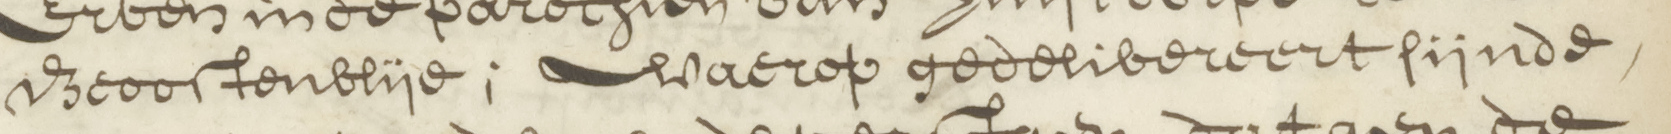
Beoostenblije; Waerop gedelibereert sijnde,
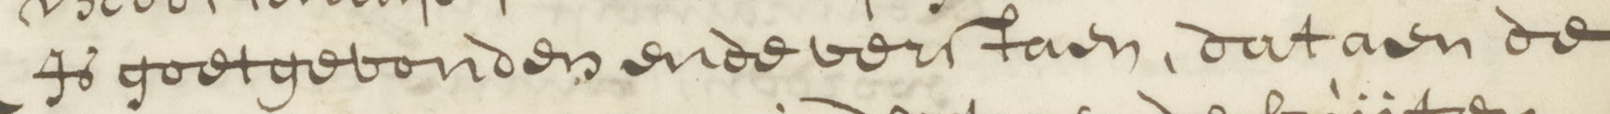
Is goetgevonden ende verstaen, dat aen de
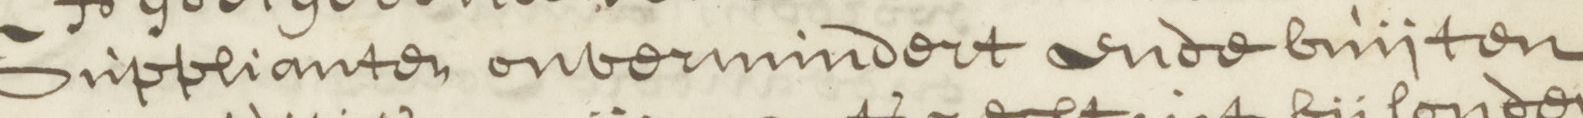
Supplianten onvermindert ende buijten
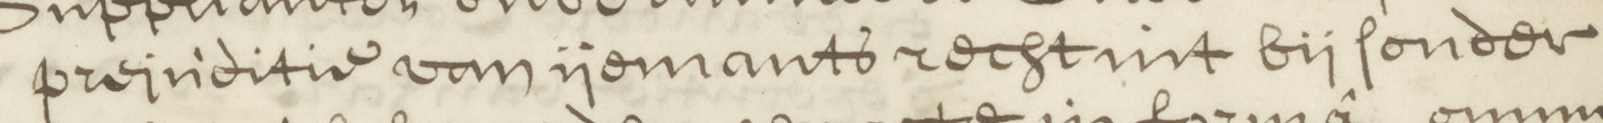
prejuditie van ijemants recht int bijsonder
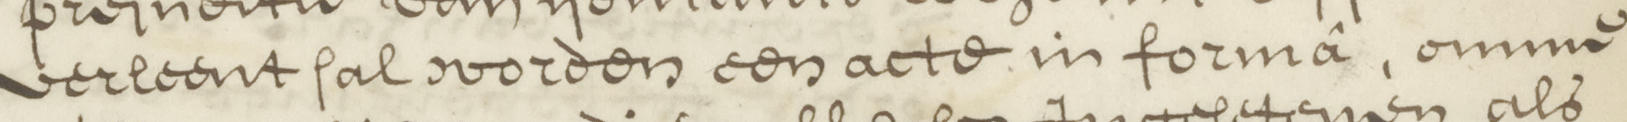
verleent sal worden een acte in forma, omme
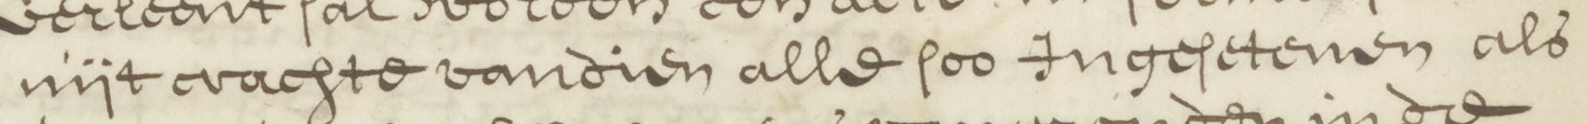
uijt crachte vandien alle soo Ingesetenen als
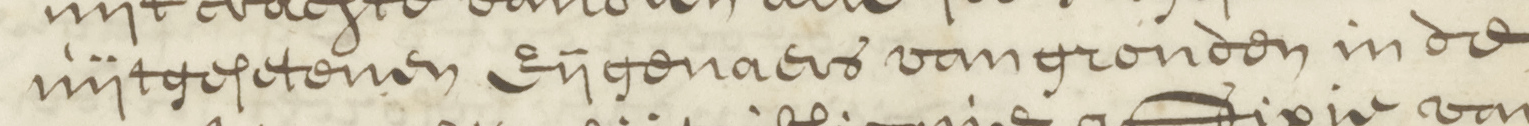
uijtgesetenen Eijgenaers van gronden in de
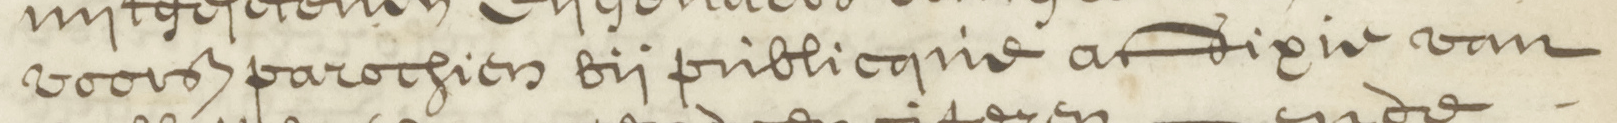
voorsz parochien bij publicque affixie van
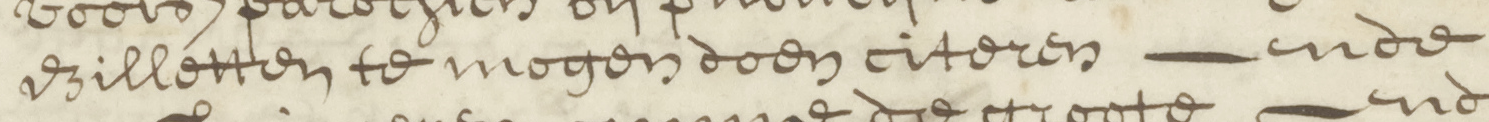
Billetten te mogen doen citeren ende
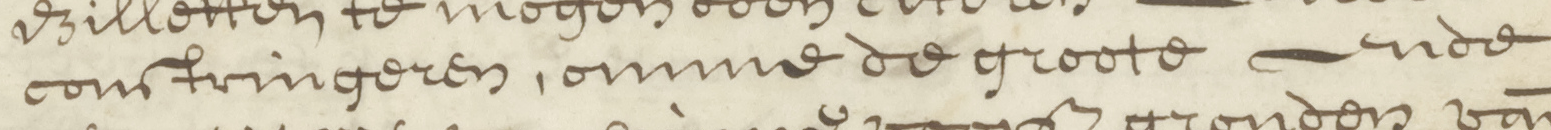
constringeren, omme de groote ende
